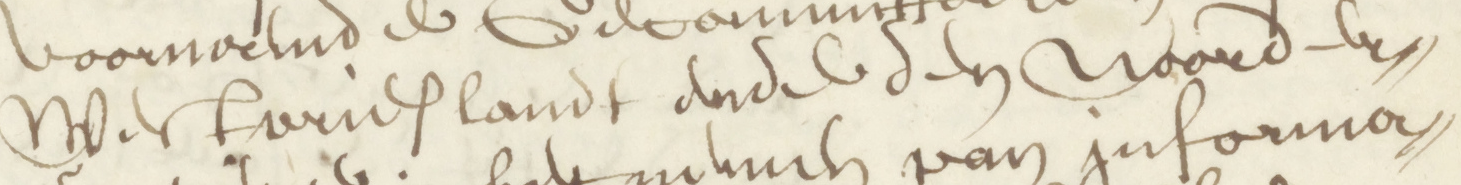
Westvrieslandt ende den Noorder„,
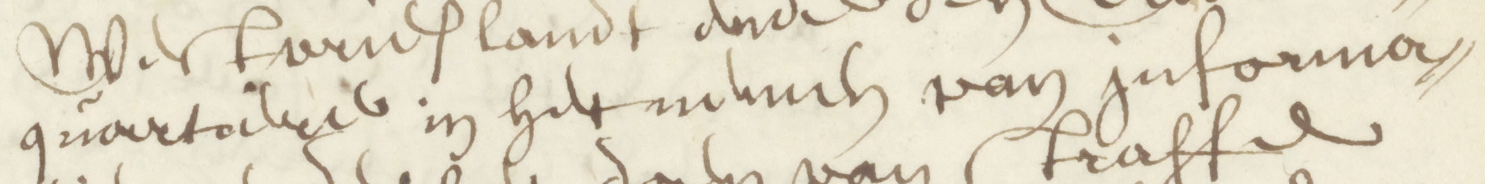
quartiere in het nemen van informa,
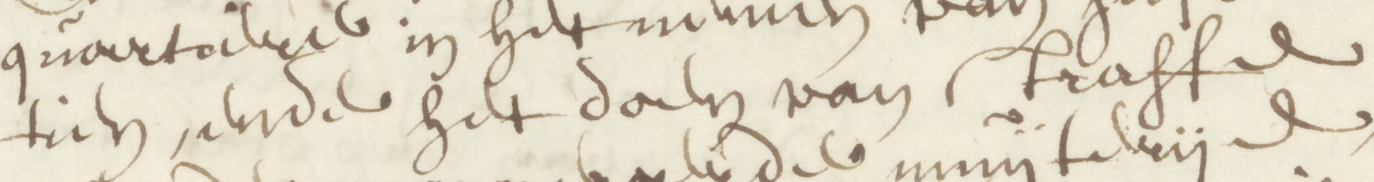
tien, ende het doen van straffe
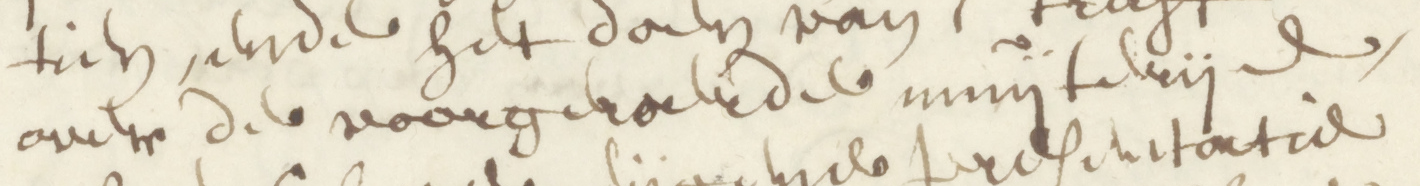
over de voorgeroerde muijterije,
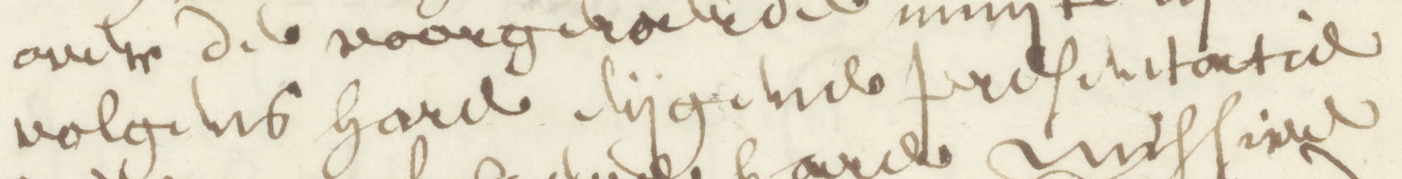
volgens hare eijgene presentatie
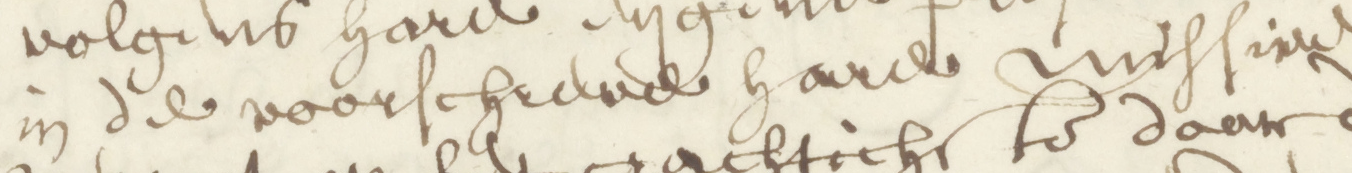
in de voorschreve hare Missive
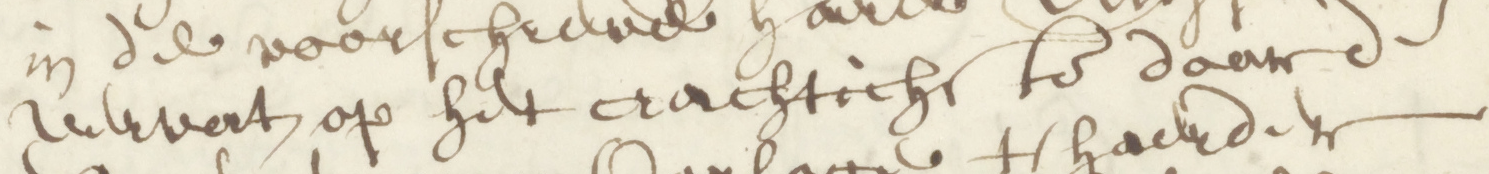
vervat, op het crachtichste door de
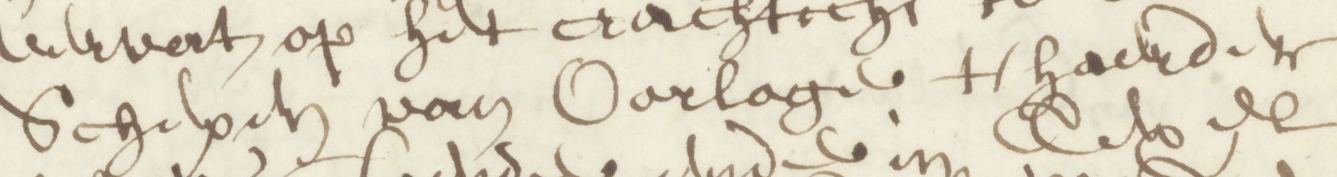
Schepen van Oorloge t'haerder
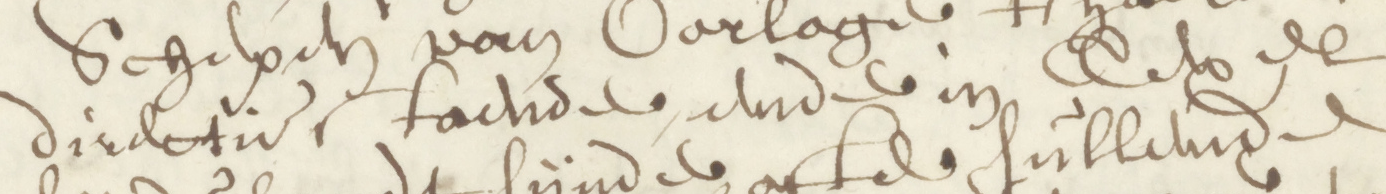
directie staende, ende in Texel
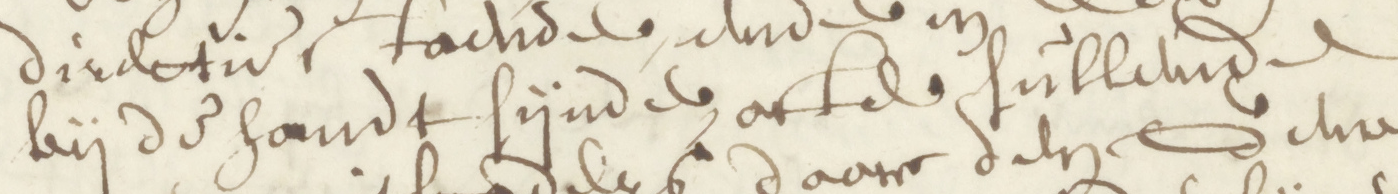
bij de handt sijnde, ofte sullende
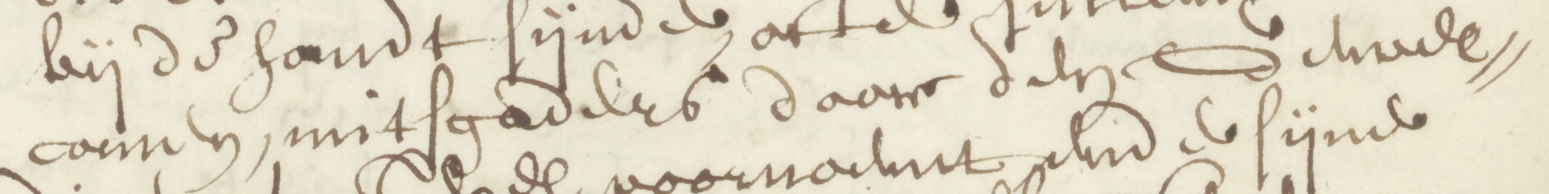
comen, mitsgaders door den Gewel„
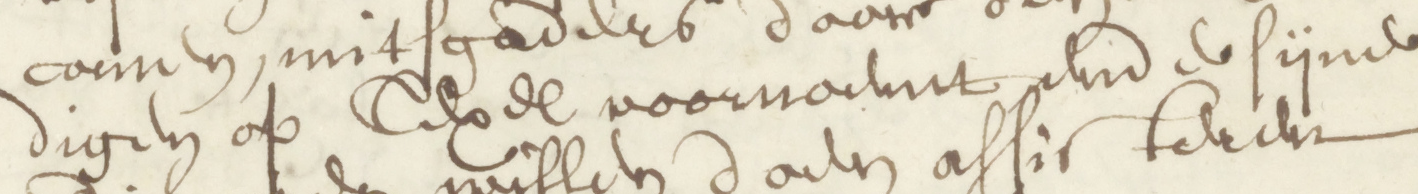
digen op Texel voornoemt ende sijne
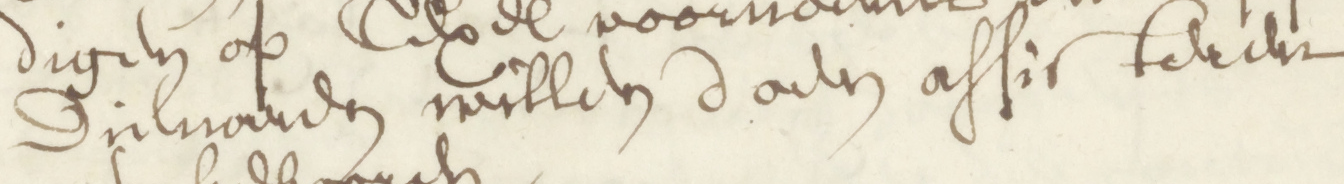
Dienaren willen doen assisteren
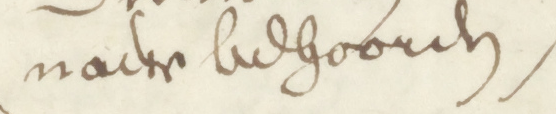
naer behooren.
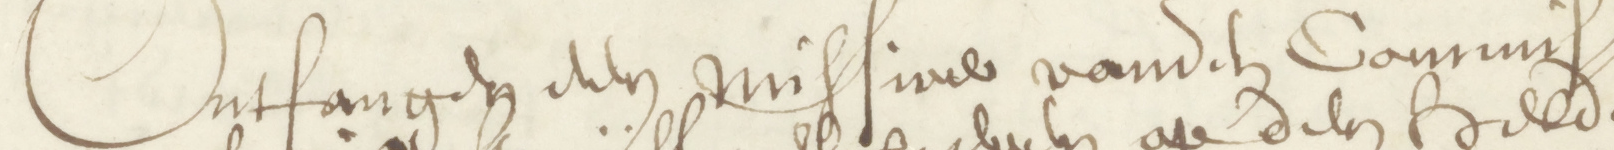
Ontfangen een missive vanden Commis,,
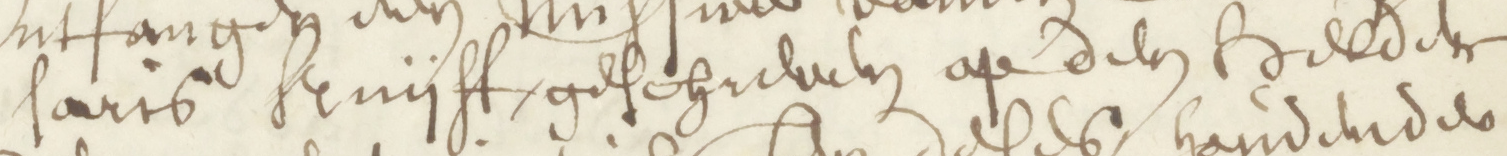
saris Kruijff, geschreven op den Helder
